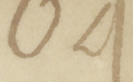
64.
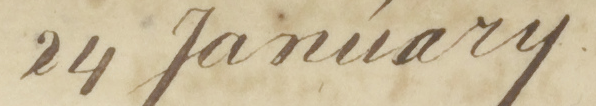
24 Januarij
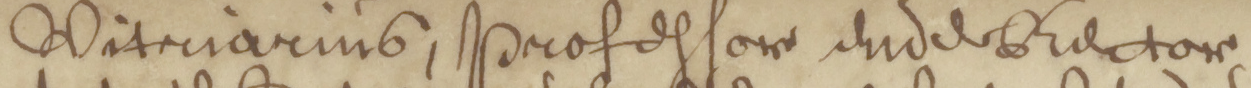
Vitriarius, Professor ende Rector
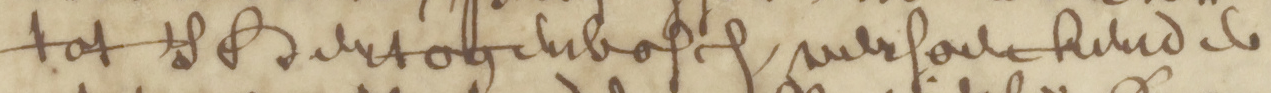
tot ‛s Hertogenbosch, versoeckende
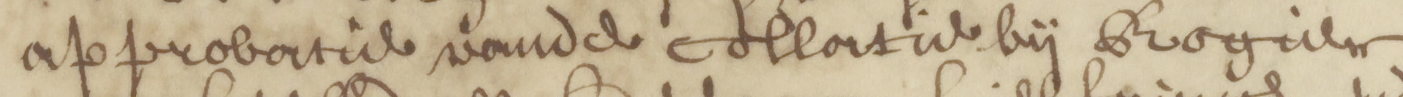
approbatie vande collatie bij Rogier
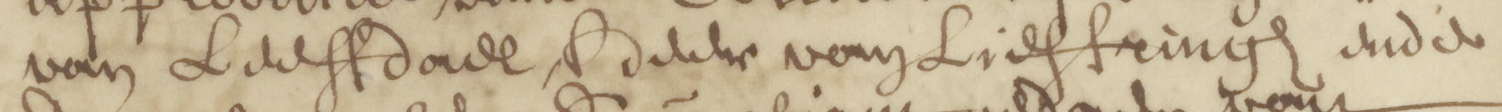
van Leeffdael, Heer van Lieffringh ende
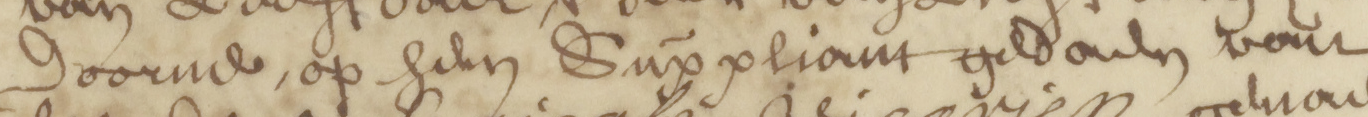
Doorne, op hem Suppliant gedaen van
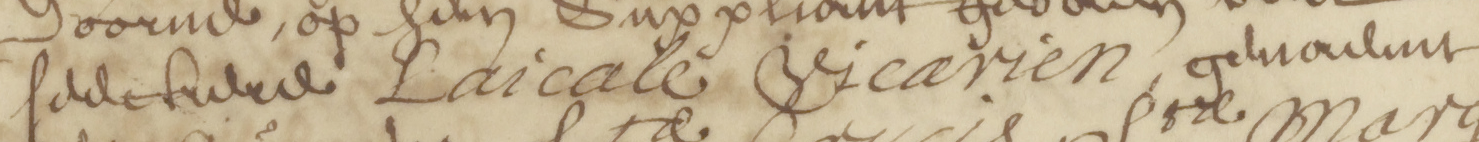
seeckere Laicale Vicarien, genaemt
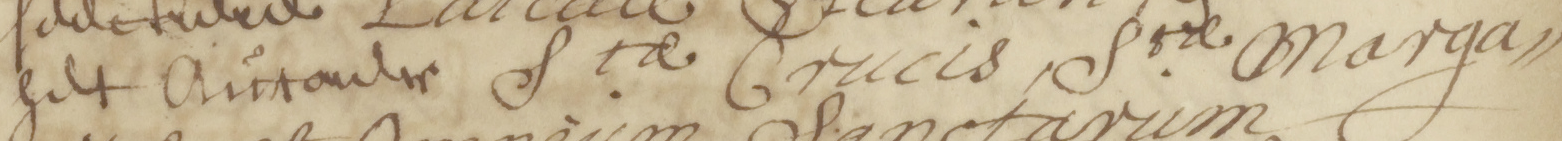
het Autaer Ste. Crucis, Ste. Marga,,
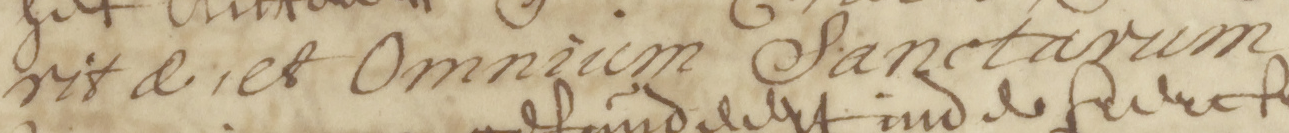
ritæ, et Omnium Sanctarum
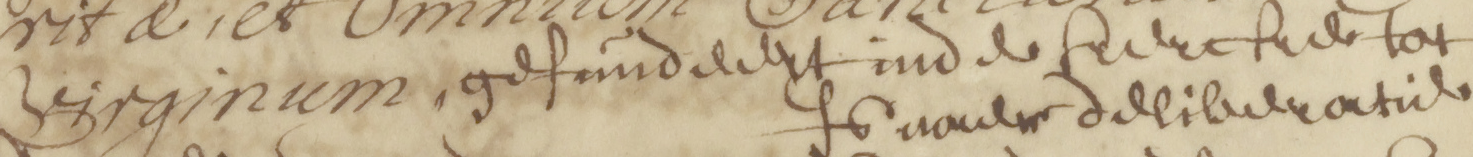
Virginum, gefundeert inde kercke tot
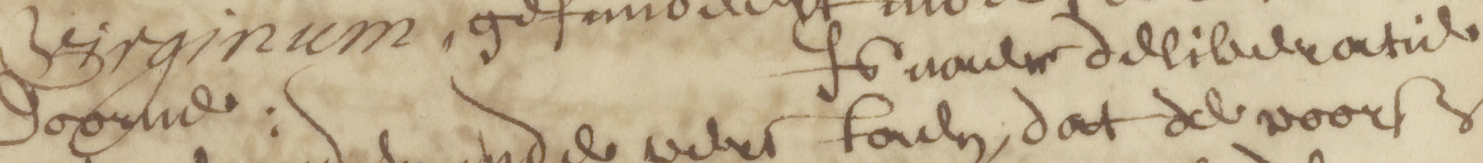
Doorne: Is naer deliberatie
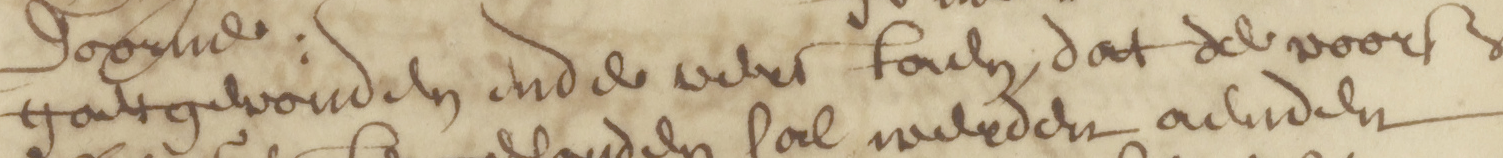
goetgevonden ende verstaen, dat de voorsz
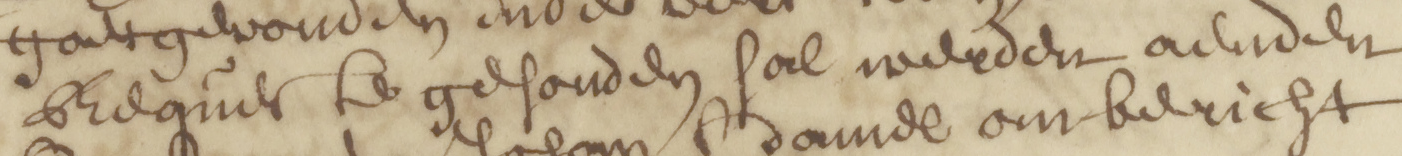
Requeste gesonden sal werden aenden
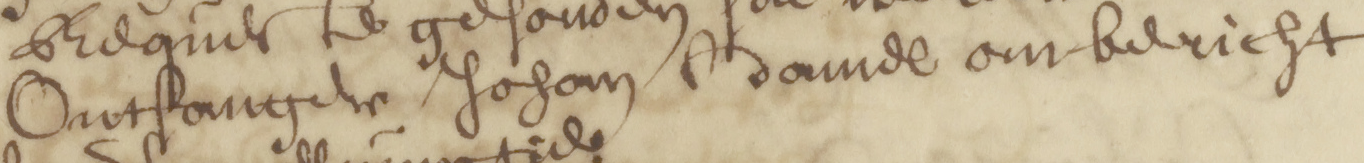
Ontfanger Johan Hamel om bericht
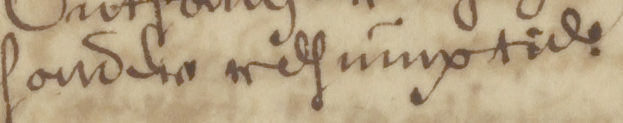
sonder resumptie.
